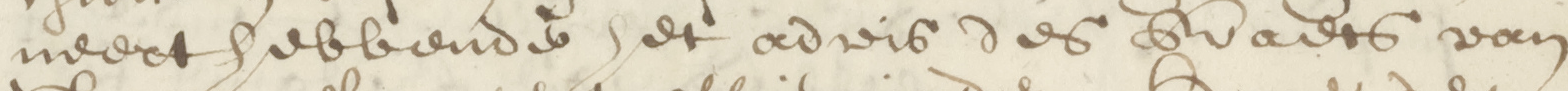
neert hebbende het advis des Raets van
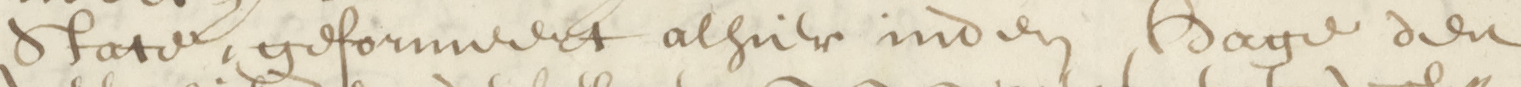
State, geformeert alhier inden Hage den
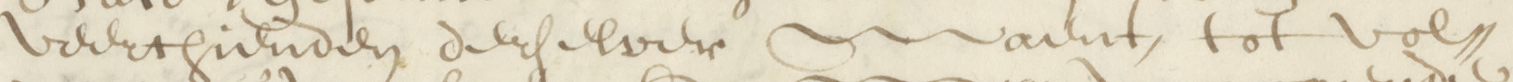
veerthienden derselver Maent, tot vol„
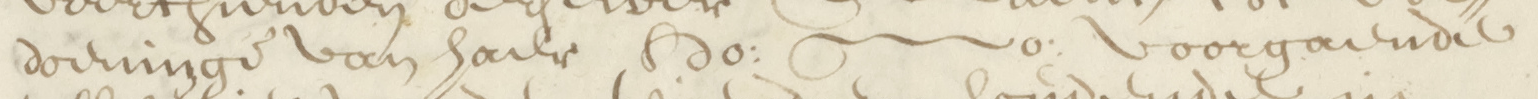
doeninge van haer Ho:Mo: voorgaende
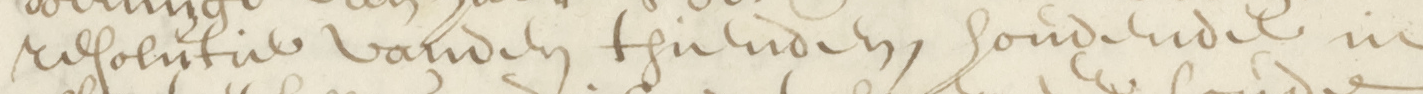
resolutie vanden thienden, houdende in
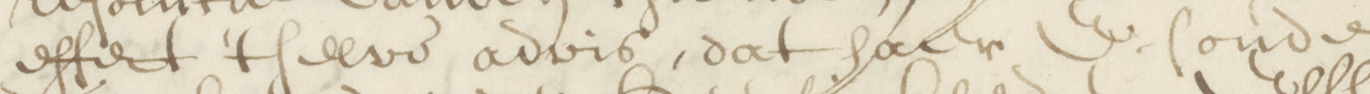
effect ‛tselve advis, dat haer E. soude
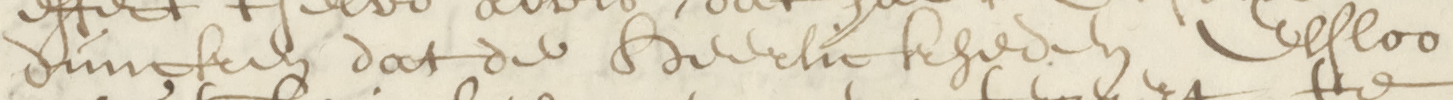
duncken dat de Heerlickheden Elsloo
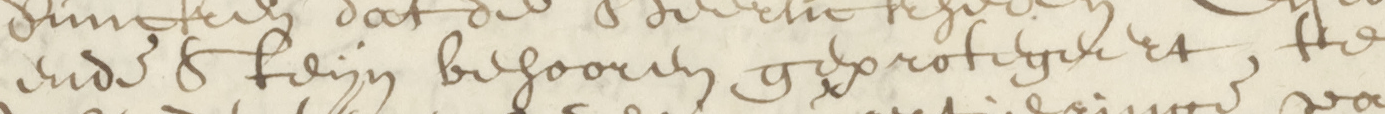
ende Steijn behooren geprotegeert te
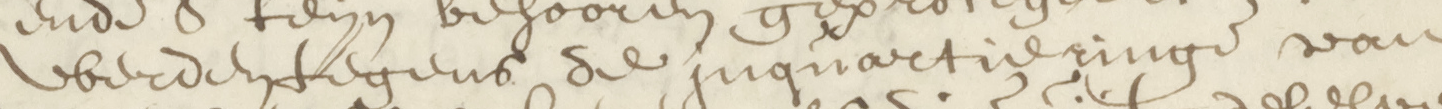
werden tegens de Inquartieringe van
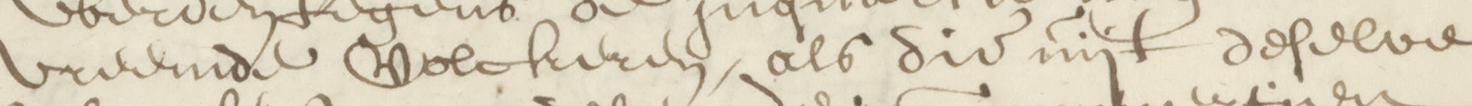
vreemde Volckeren, als die uijt deselve
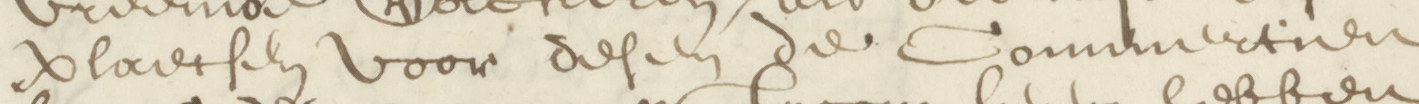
plaetsen voor desen de commertien
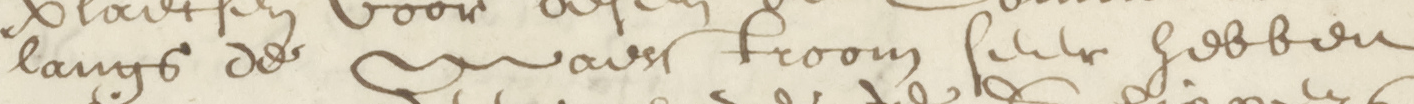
langs de Maesstroom seer hebben
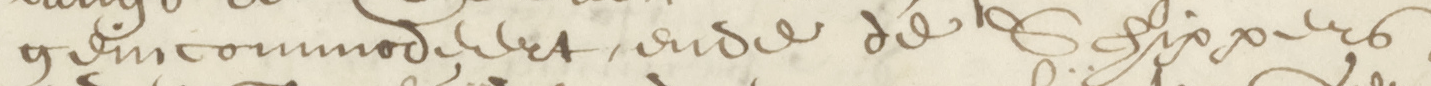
geincommodeert, ende de Schippers
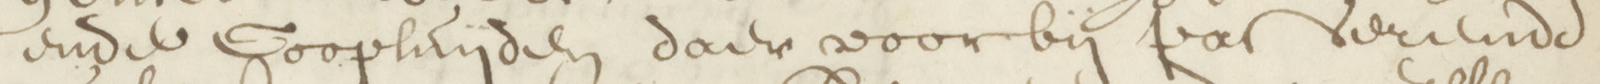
ende Coopluijden daer voor bij passerende
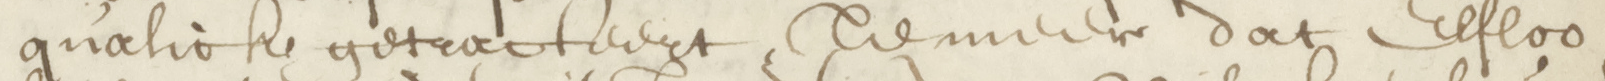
qualick getracteert, Te meer dat Elsloo
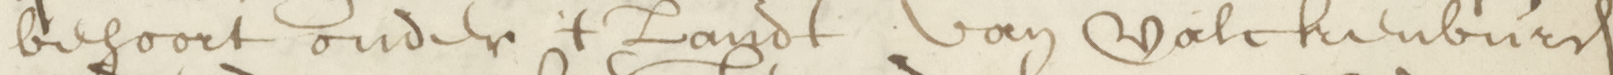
behoort onder ‛t Landt van Valckenburch
